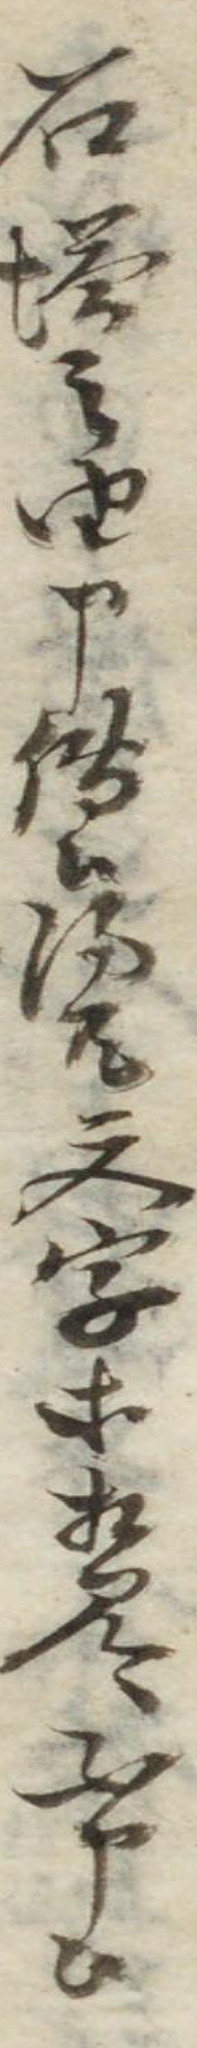石塔之由申伝候得共文字等相見へ不申候
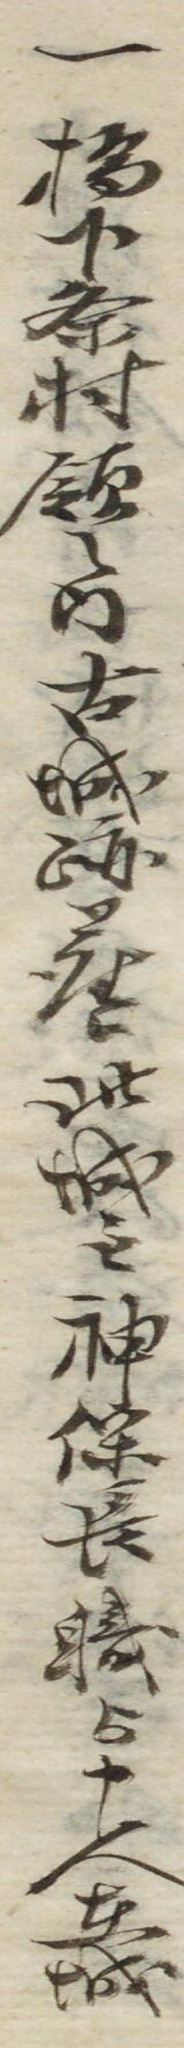一橋下条村領之内古城跡御座候此城主神保長職与申人在城
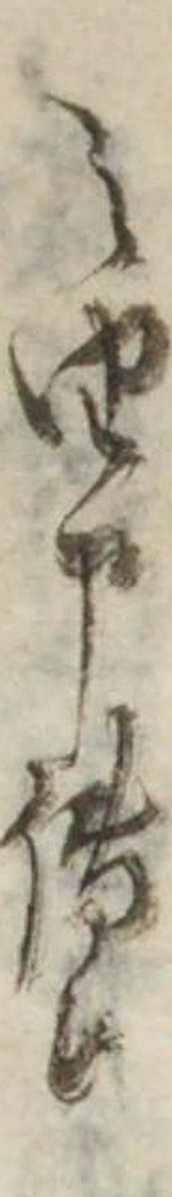之由申伝候
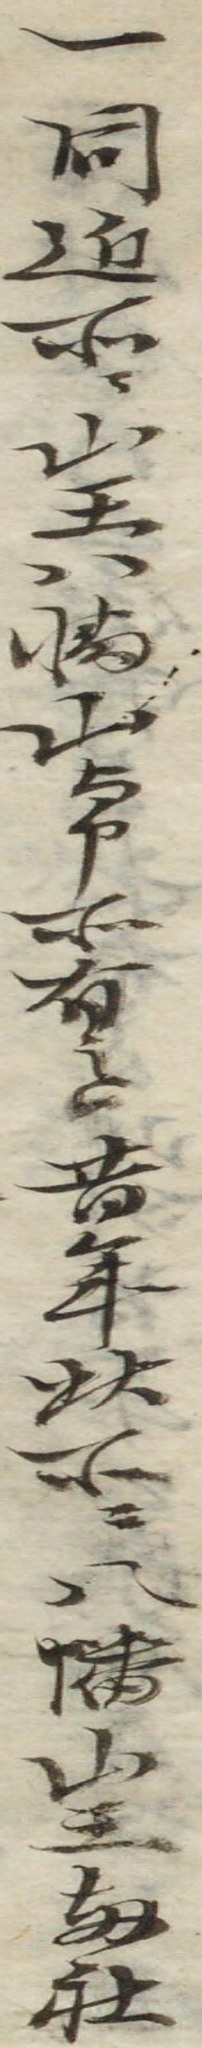一同近所に山王八幡山与申所有之候昔年此所に八幡山王両社
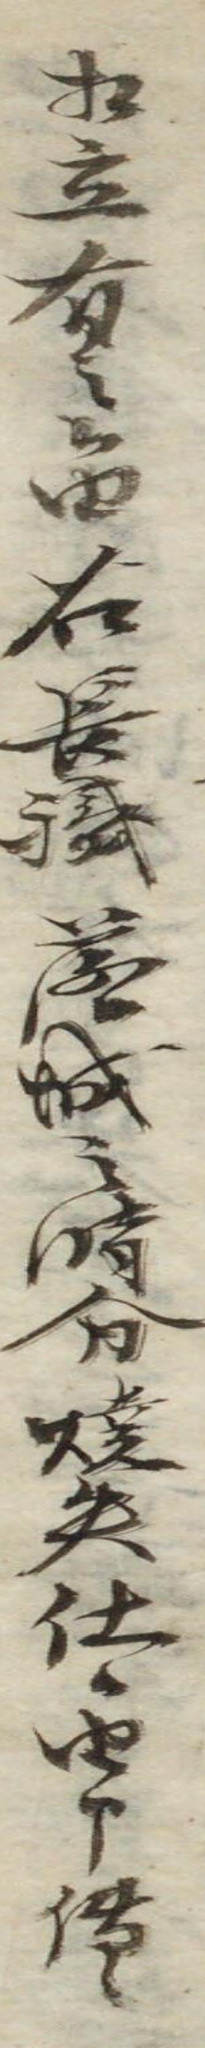相立有之候由右長職落城之時分焼失仕候由申伝候
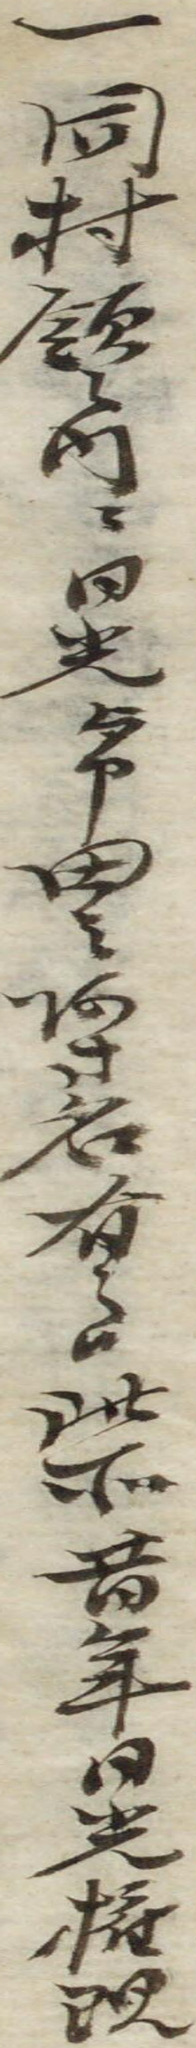一同村領之内に日光与申田之あさ名有之候此所昔年日光権現
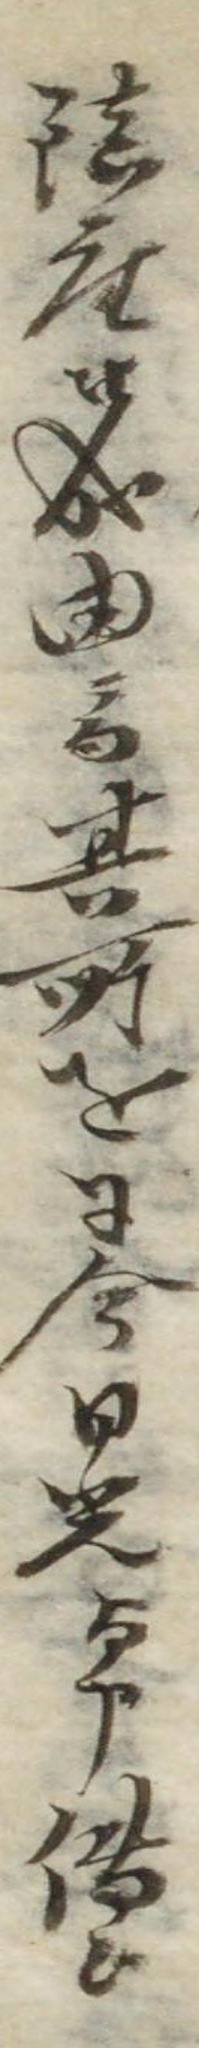鎮座被成由に而其所を于今日光与申伝候
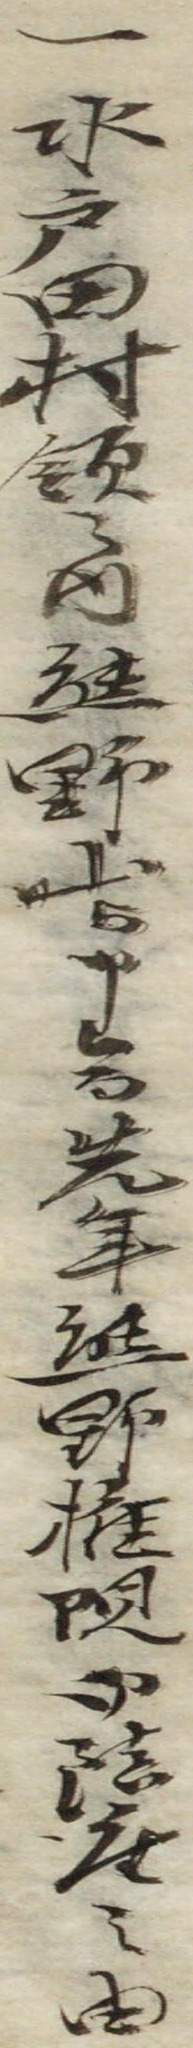一水戸田村領之内熊野山与申候而先年熊野権現御鎮座之由
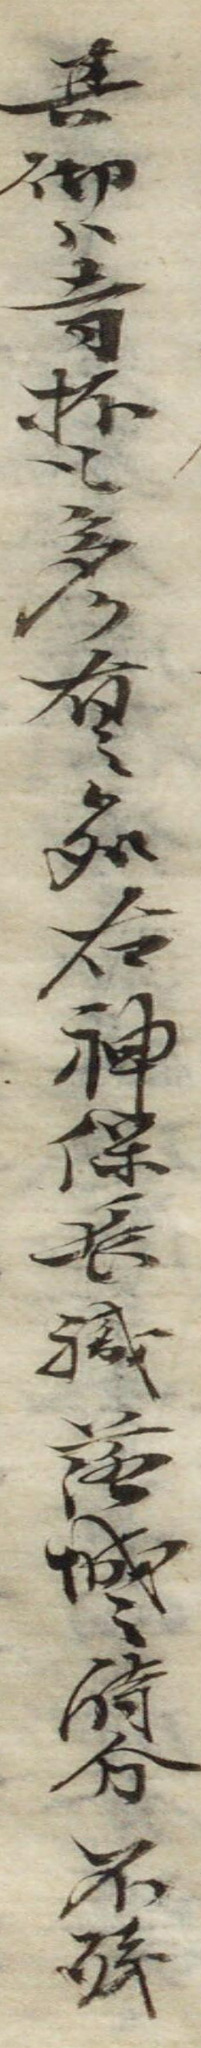其砌は寺抔も多く有之候処右神保長職落城之時分不残
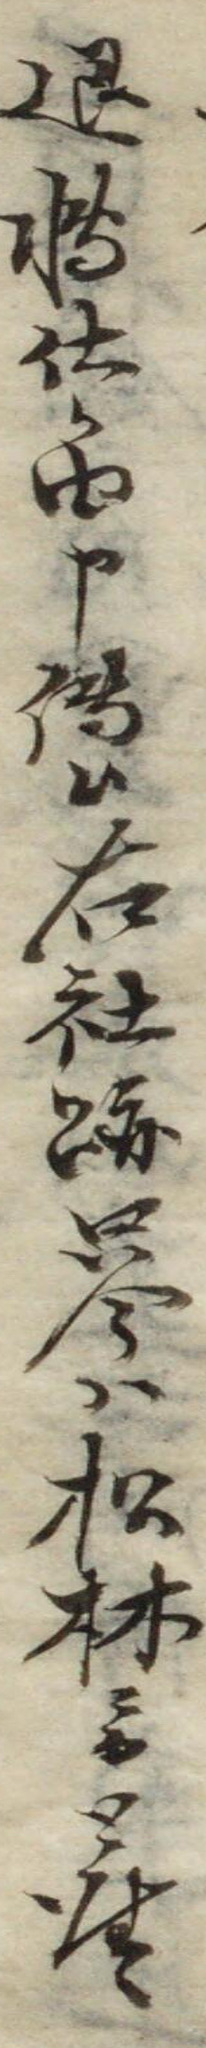退転仕候由申伝候右社跡只今は松林に而御座候

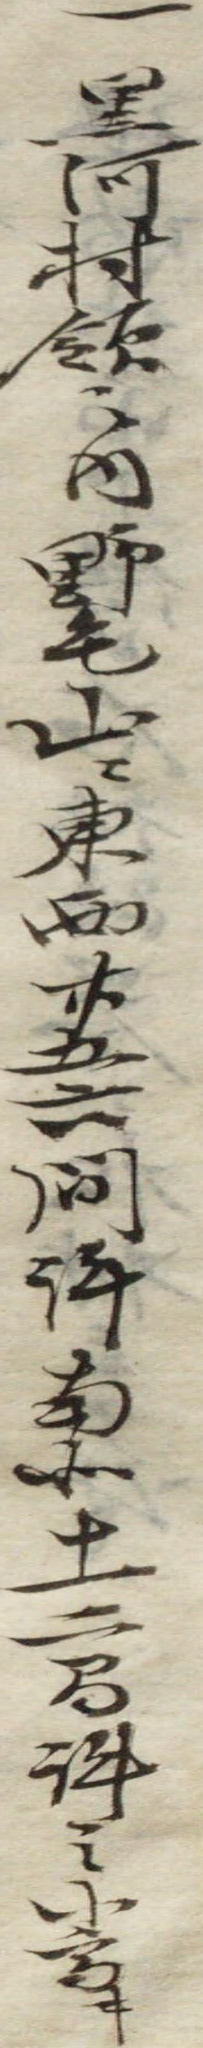一黒河村領之内野毛山に東西廿五六間許南北十二間許之小高き
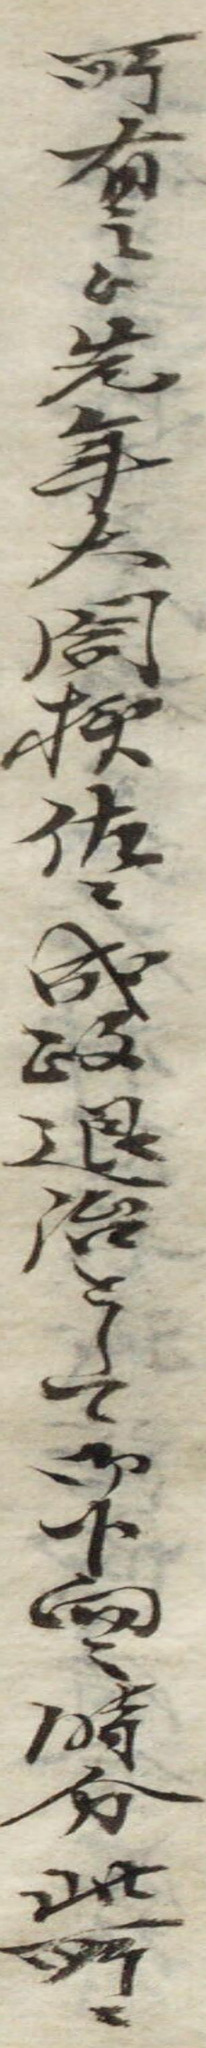所有之候先年太閤様佐々成政退治として御下向之時分此所に
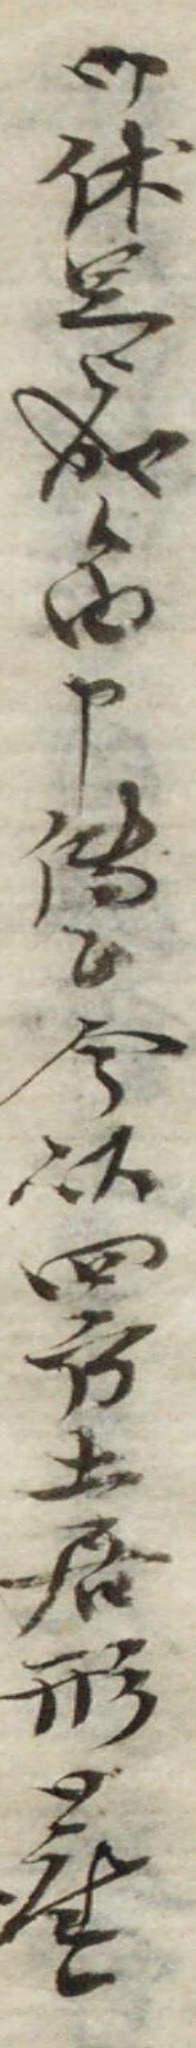御休足被成候由も申伝候今以四方土居形御座候
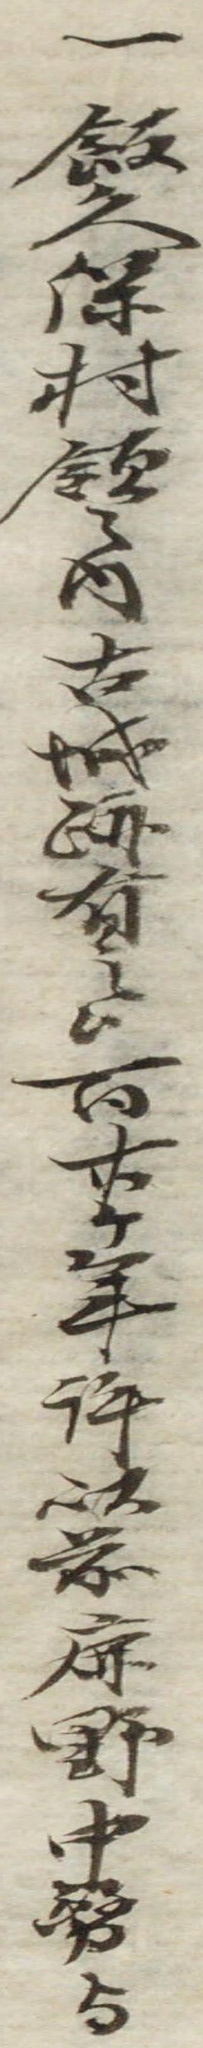一飯久保村領之内古城跡有之候百廿ヶ年許以前鹿野中務与
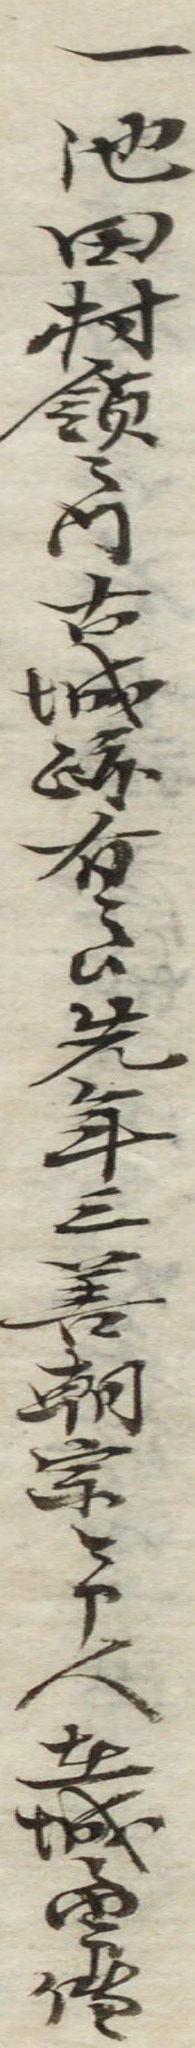一池田村領之内古城跡有之候先年三善朝宗と申人在城之由申伝候
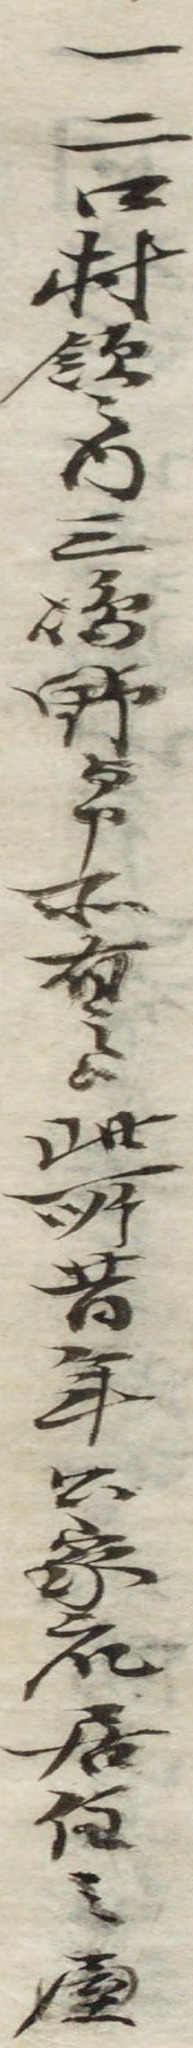一二口村領之内三嶋野与申所有之候此所昔年公家衆居住之屋
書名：加越能旧聞録
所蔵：Ishikawa Prefectural Library
